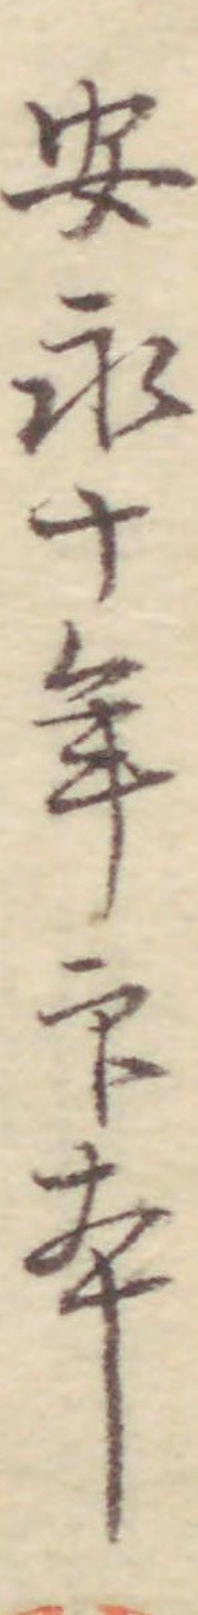安永十年印本
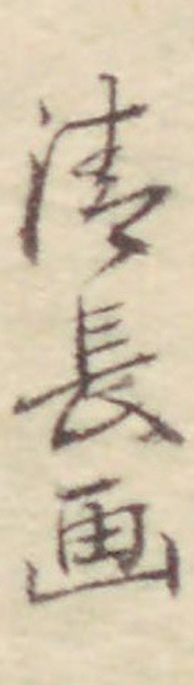清長画
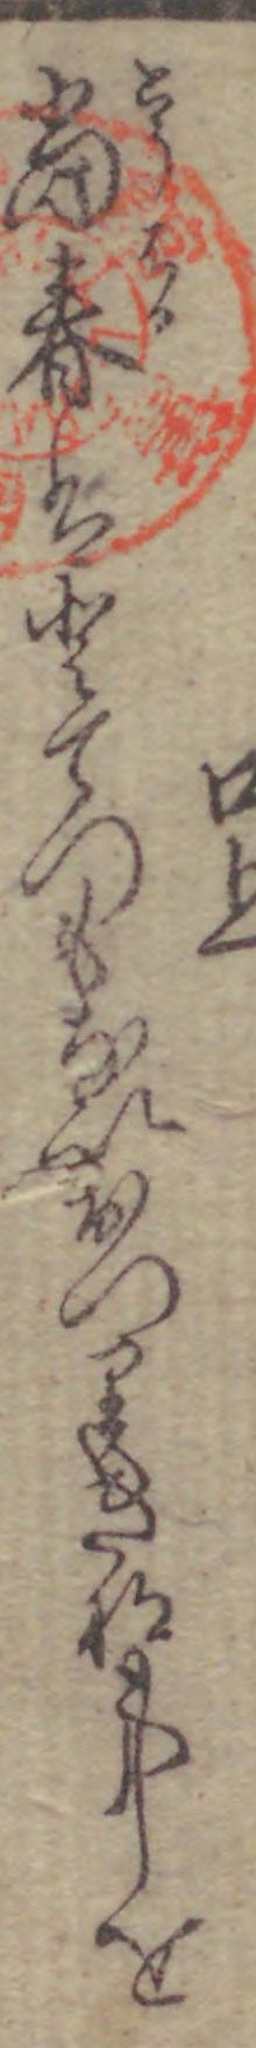当春はとてつもないおつりきな事を
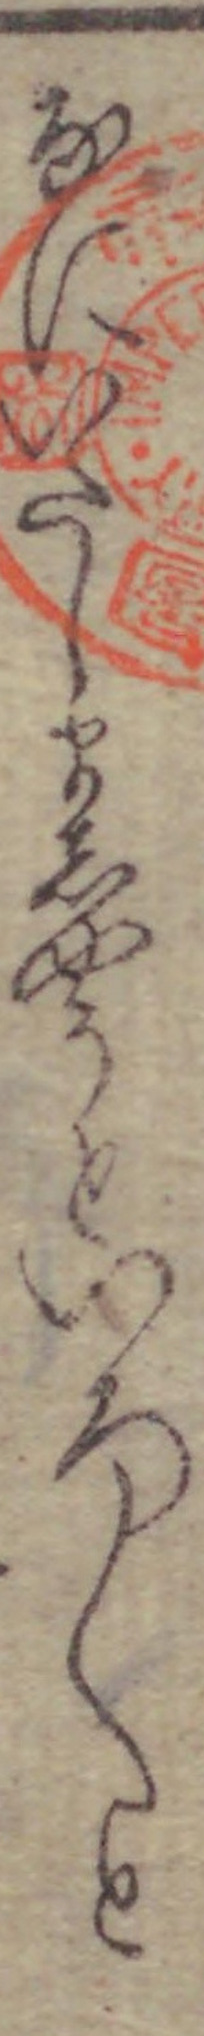なにいたしましやうといろ〳〵と
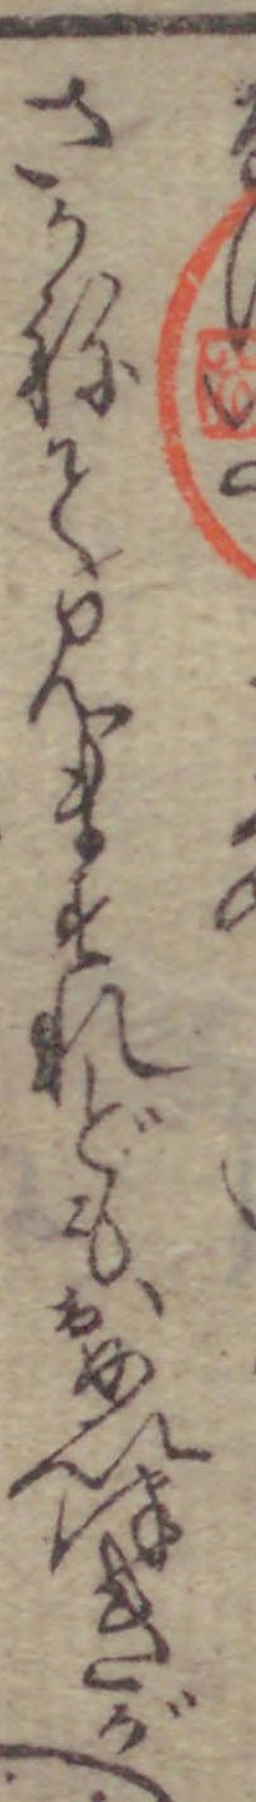さかねて見ますれどもおもいつきが
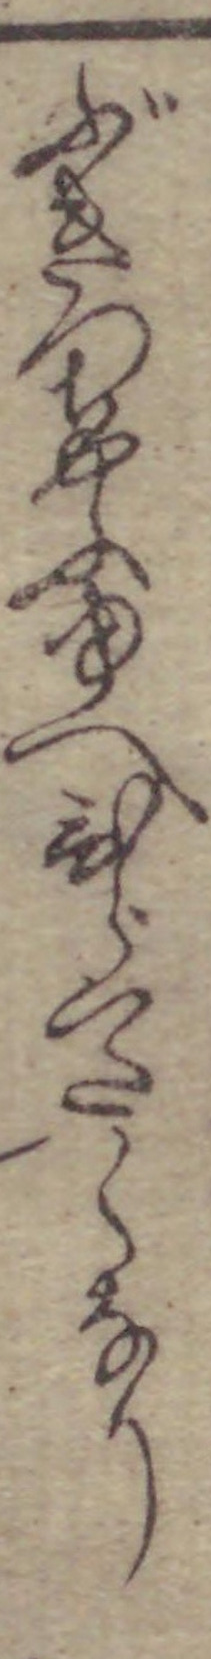ぶきつちやふゆへひらつたくなり
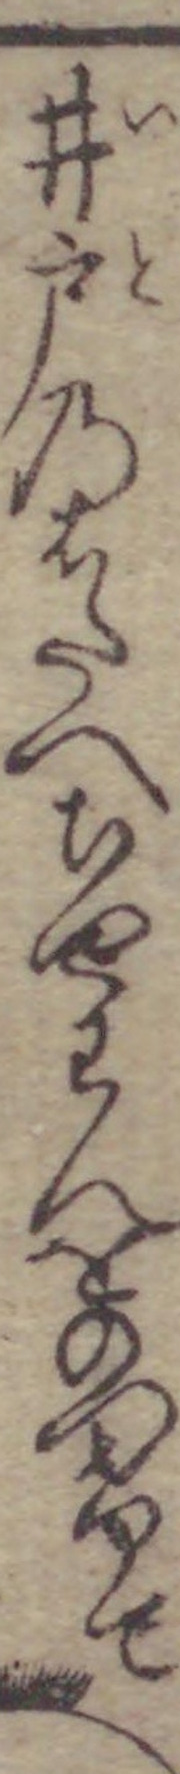井戸のはたへちやわんをのつけて
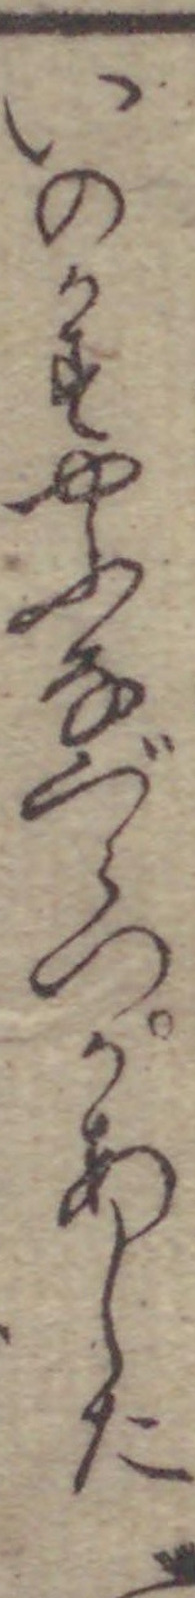いのかすやふなぐらいかあした
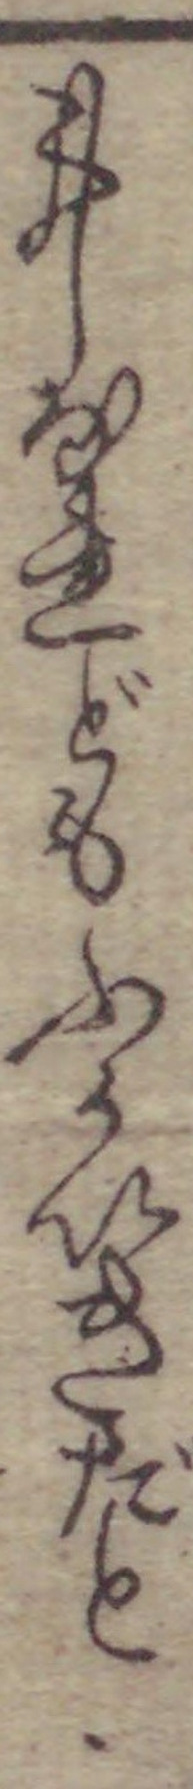事なれどもふかいきだと
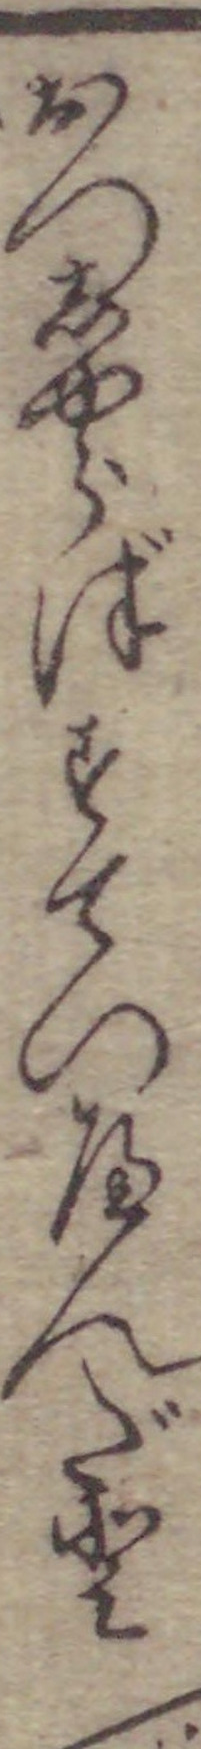おつしやらづすていへんだと
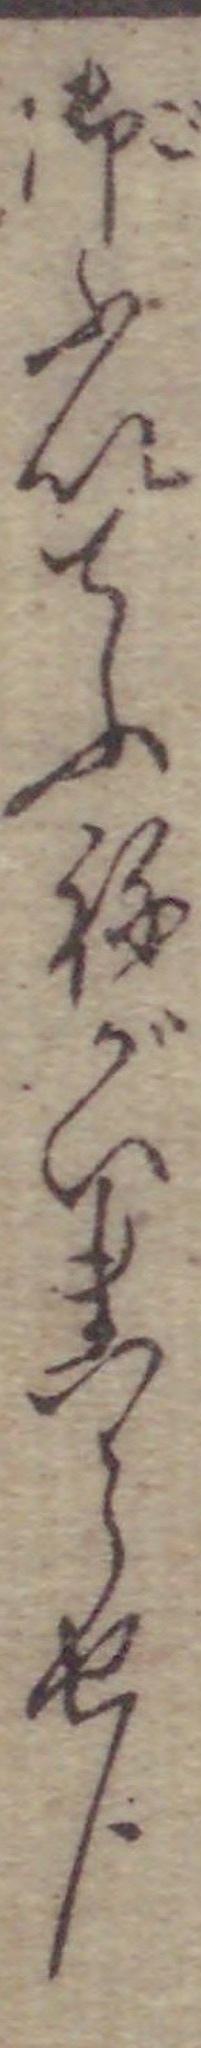御ふいてふねがいまいらせ候
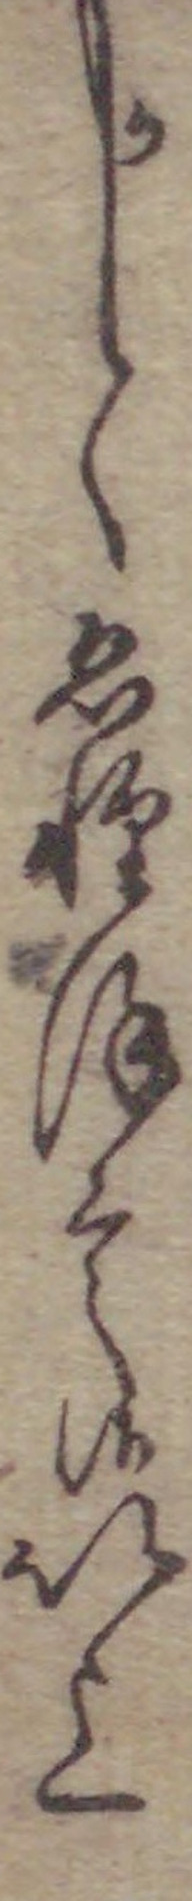かしく恐惶謹言候以上

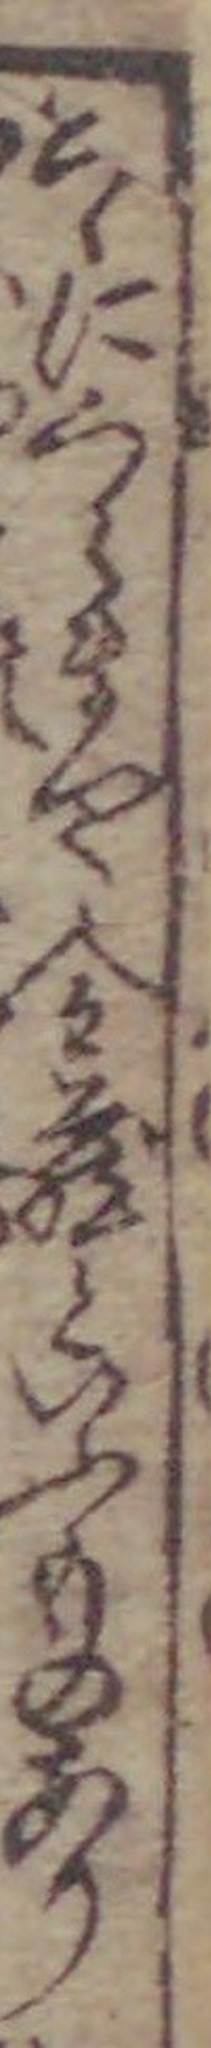こゝにくらまや金蔵といふものあり
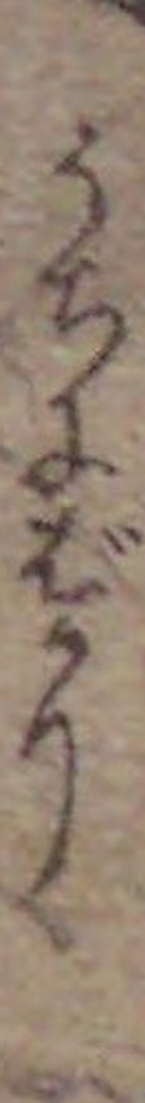うちにばかり
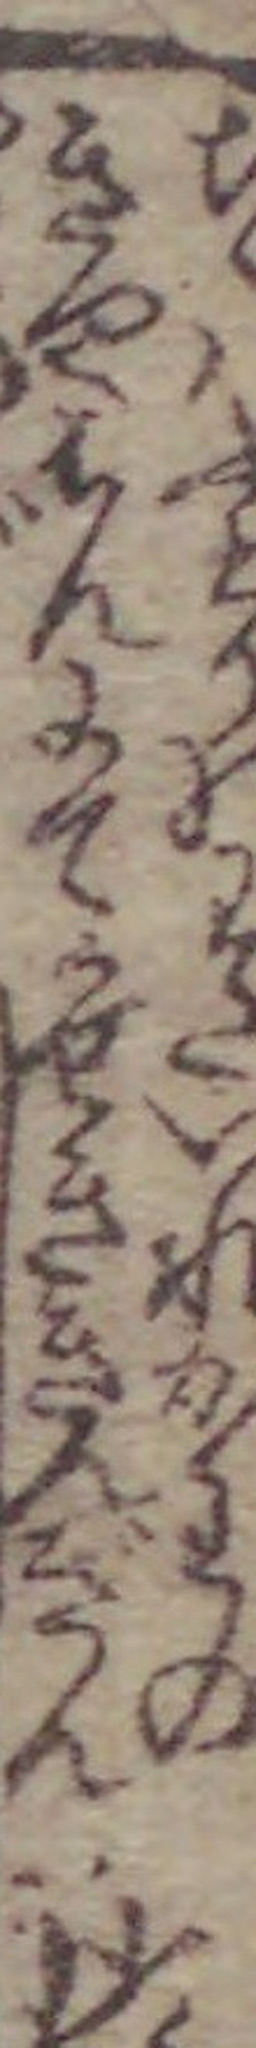きやはんにてかせききんぎん
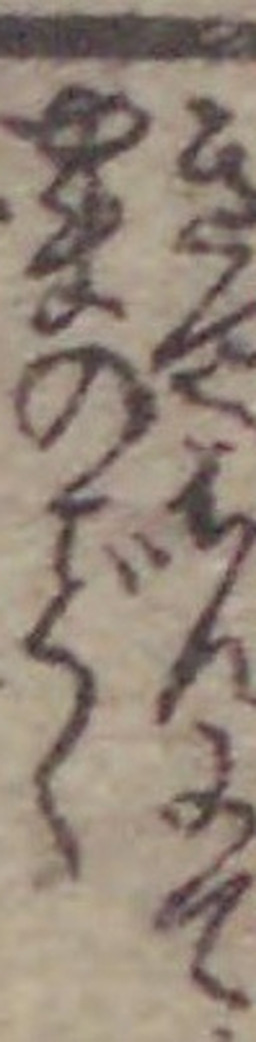やまのごとく
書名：御代の御寶
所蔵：国立国会図書館 National Diet Library, JAPAN
